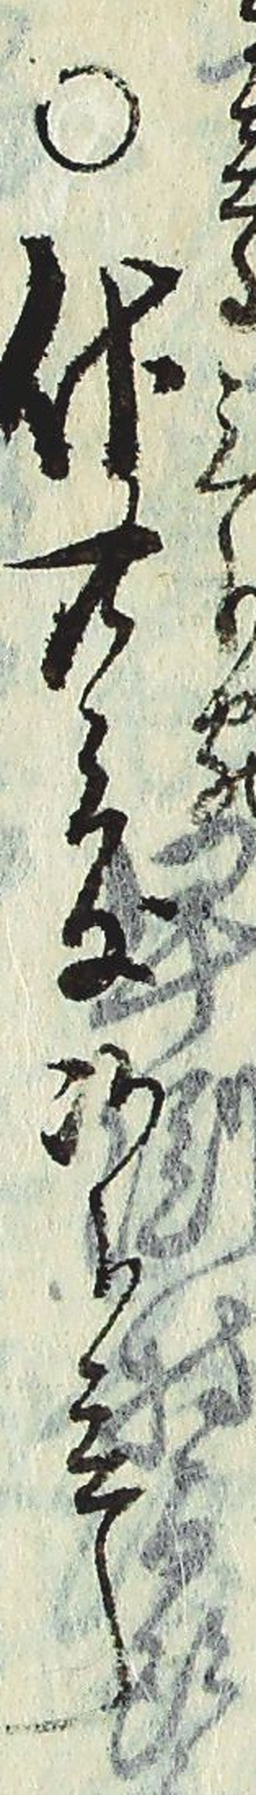代廿三匁弐分壱厘
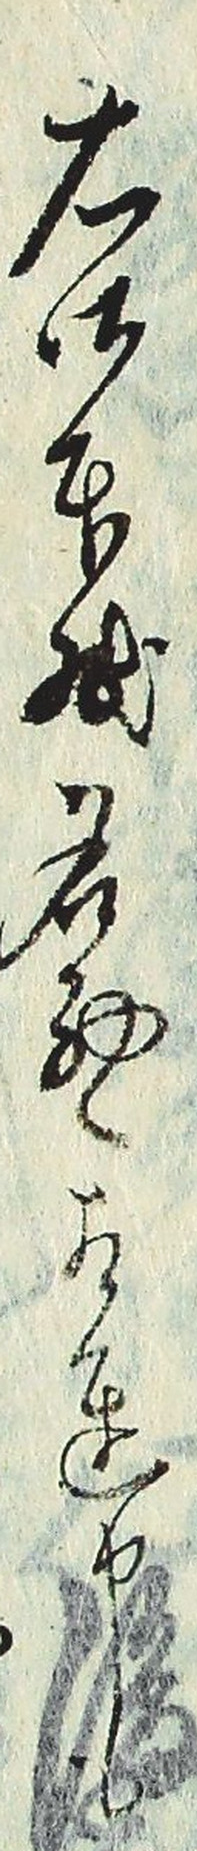右御本紙名西へ相達申候
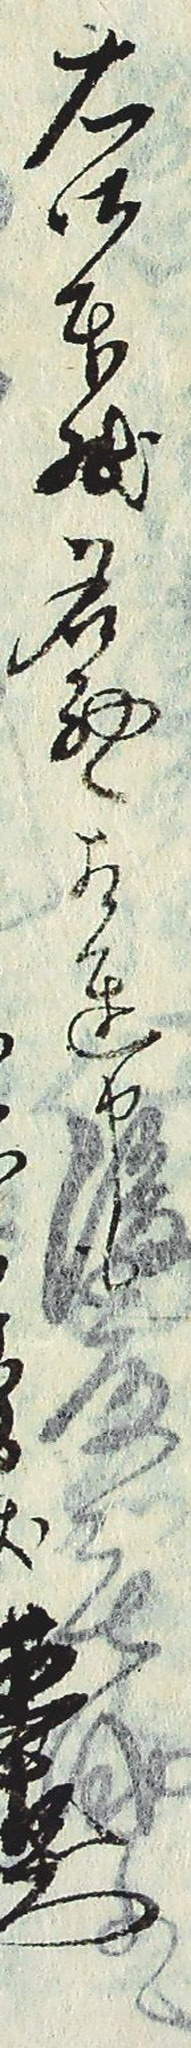右御本紙名西へ相達申候
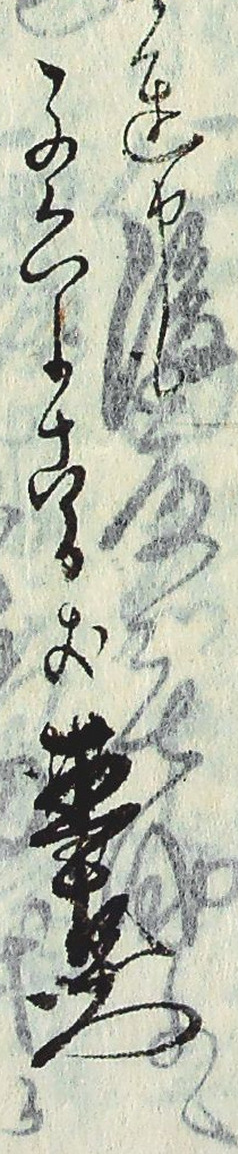子六月十四日使直左衛門

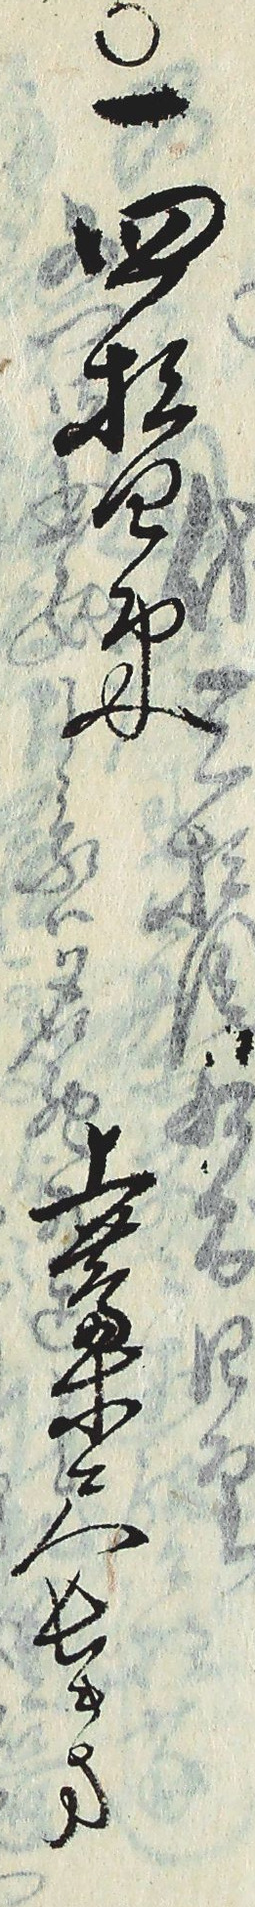一四拾四束上藁尺長き方
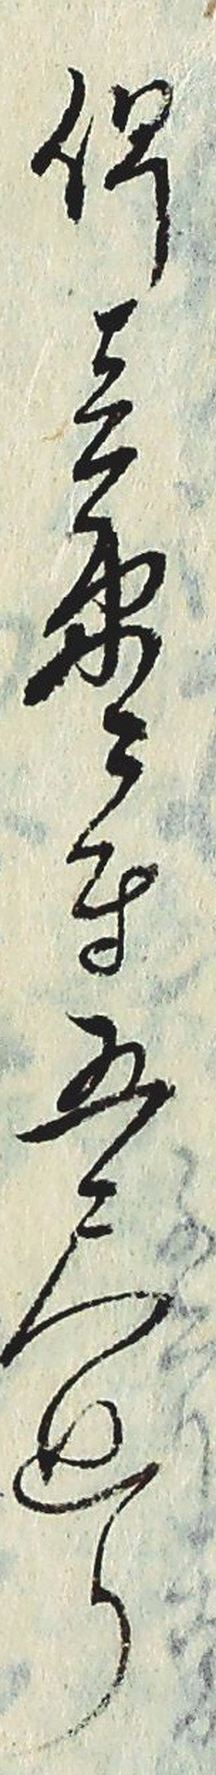但し壱束に付五尺廻り
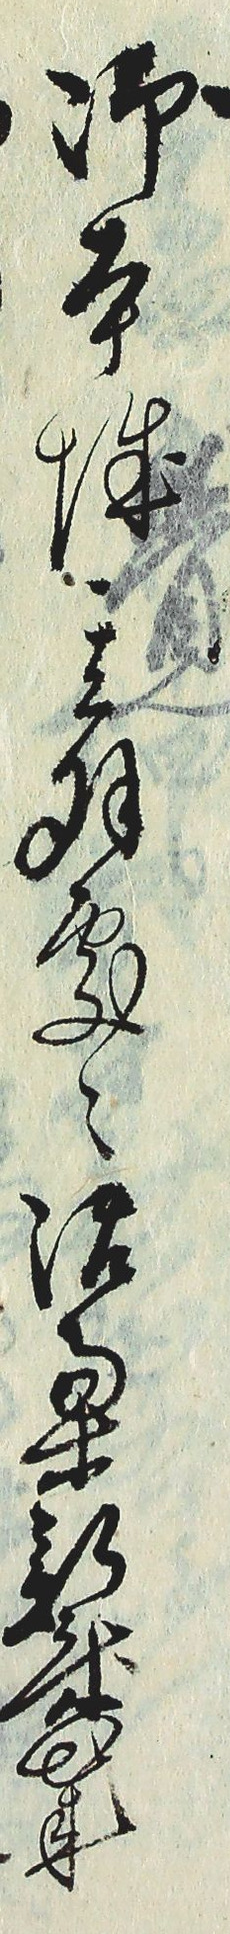御本城其外処々御畳新床出来
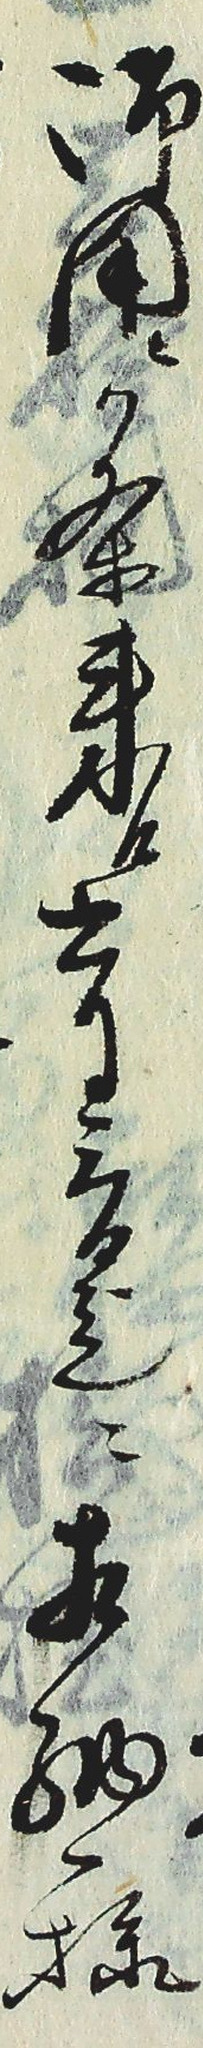御用に候条来る六月三日迄に相納候様
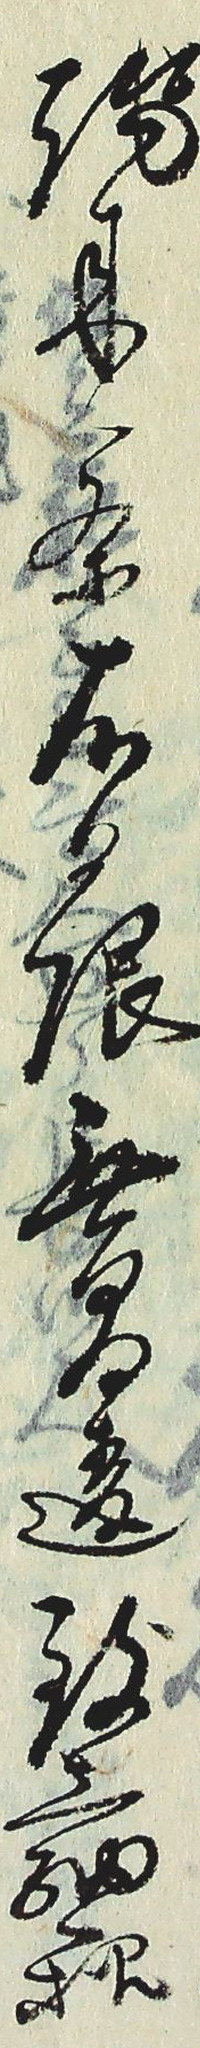誂来候条右日限無間違致上納候様
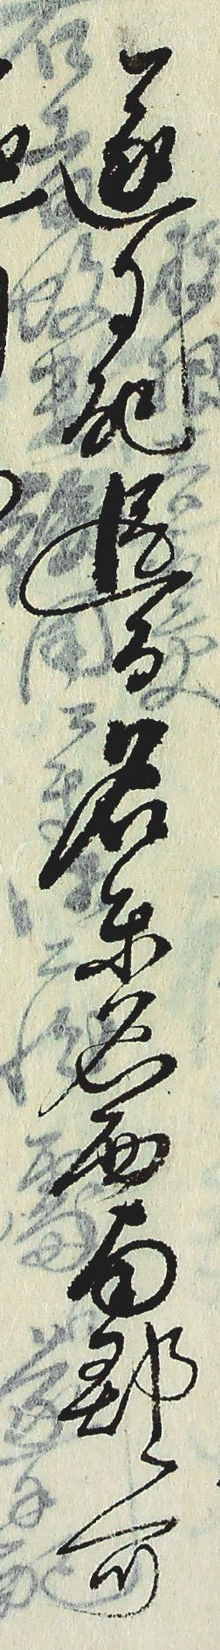遂手配追て名東名西両郡へ可
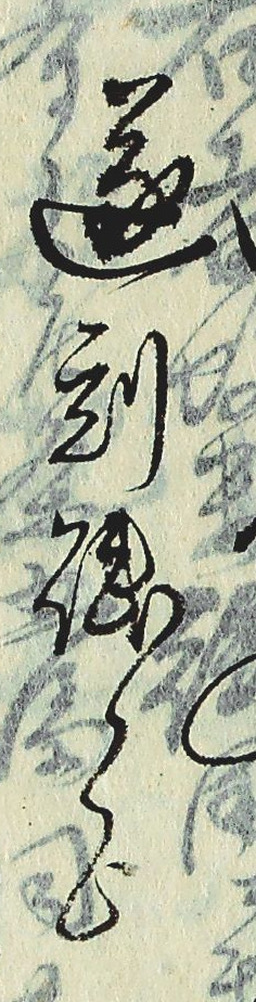遂割賦候以上
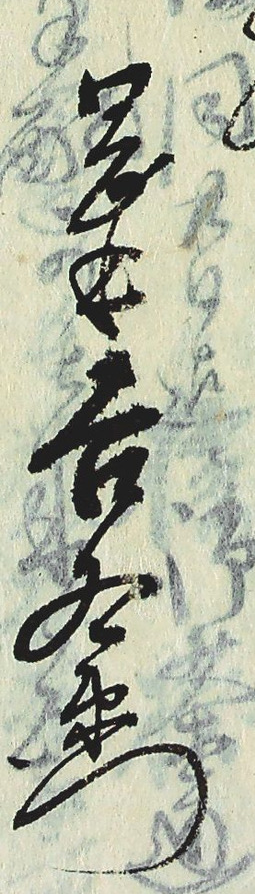岡本吉右衛門
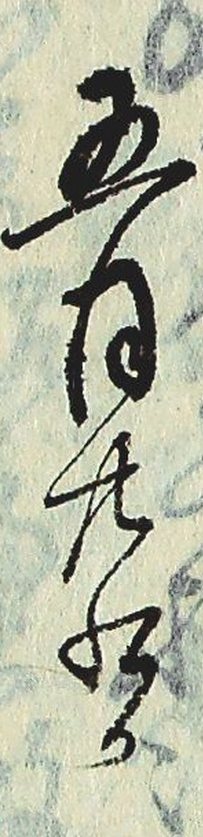五月廿九日
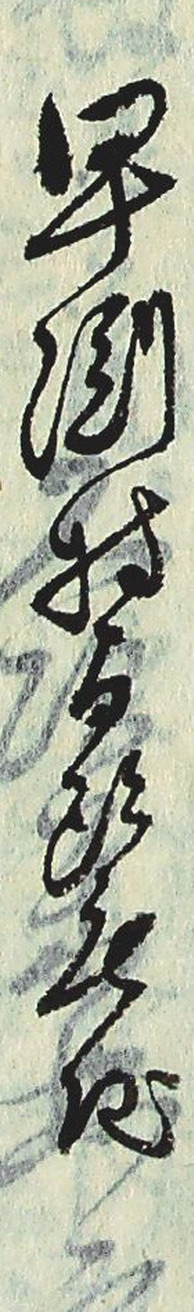早淵村与頭庄屋
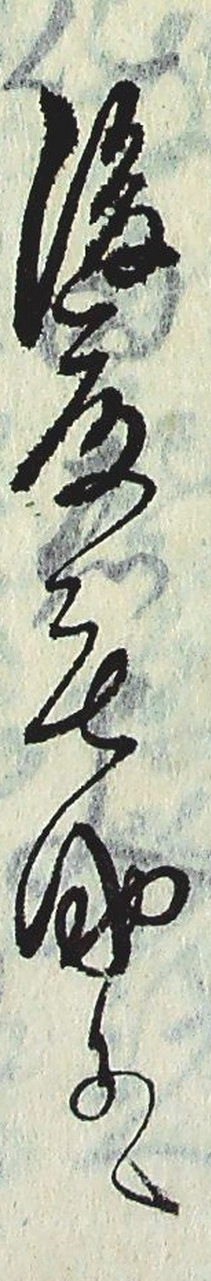後藤庄助方へ
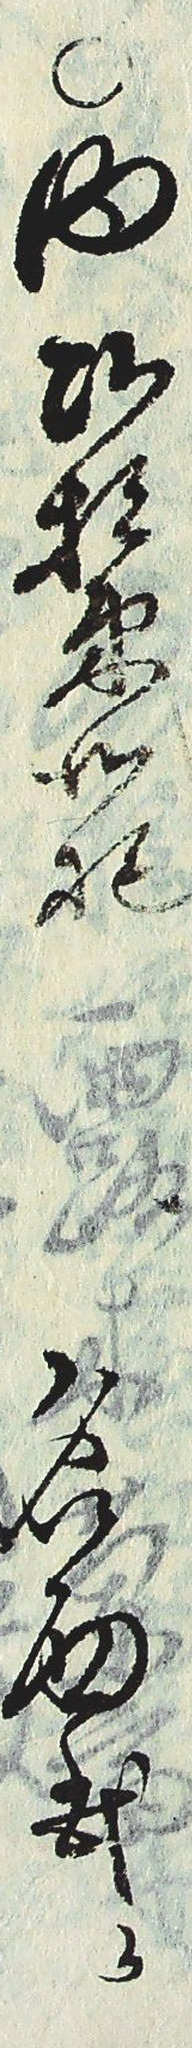内弐拾束弐把名西当り
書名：名東郡中諸割賦元帳
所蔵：鳴門教育大学 Naruto University of Education
